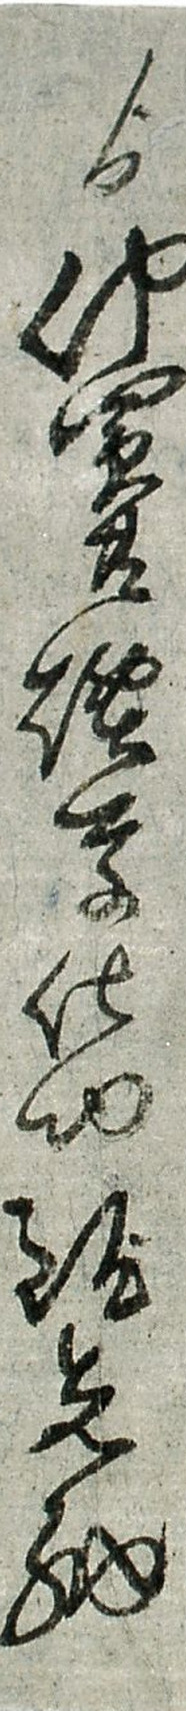ゟ仲買共煙草仕切銀先納
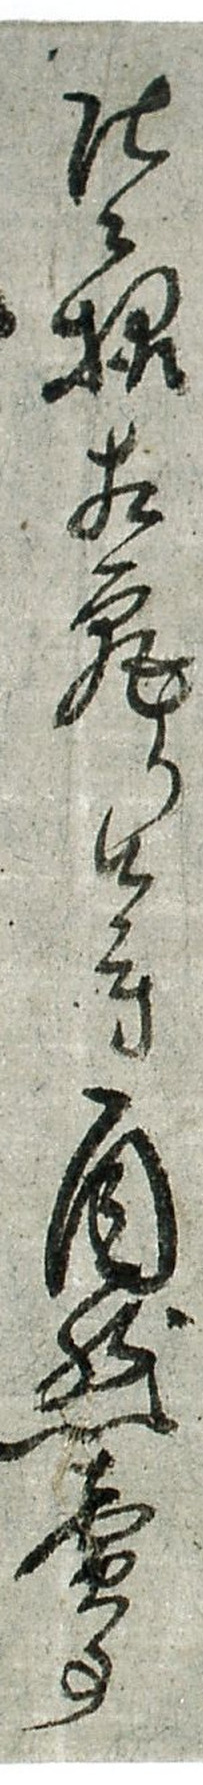仕候様相究り候に付自然売事
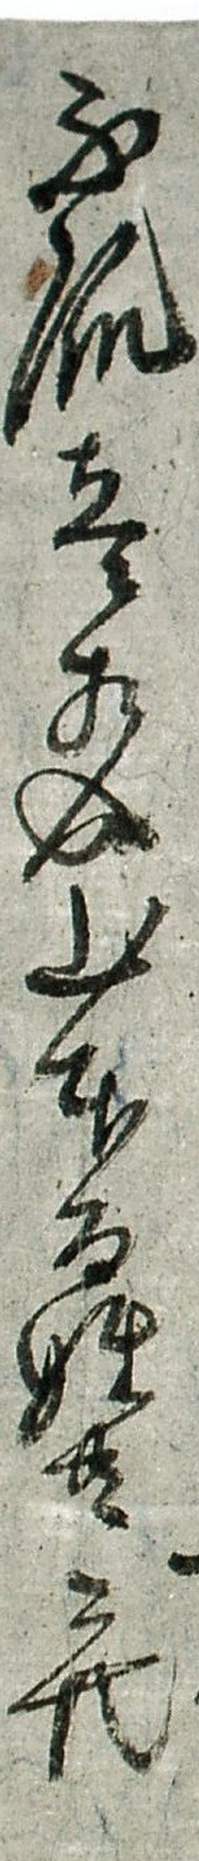不派立に相成山本百姓共并
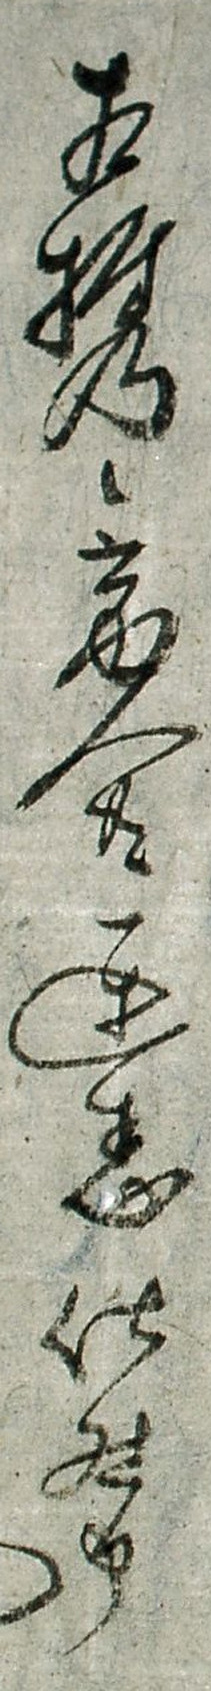相携候商人共迷惑仕居申
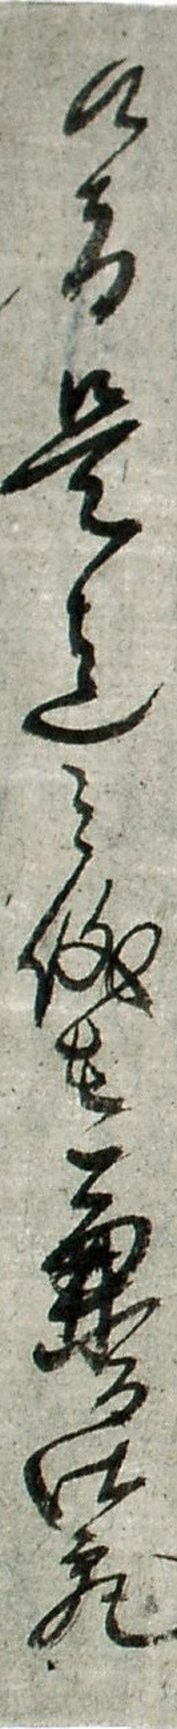候旨是迄之儀は兼て御究
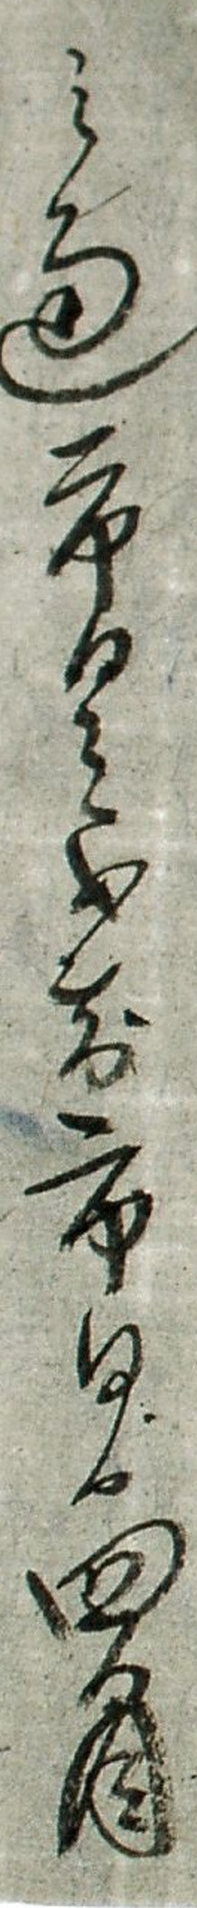之通市日之義前市日ゟ四日目
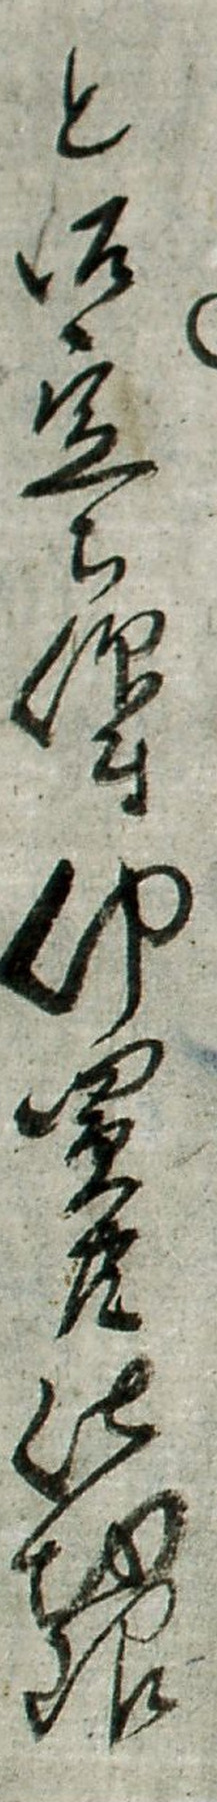と御定被仰付仲買共仕切銀
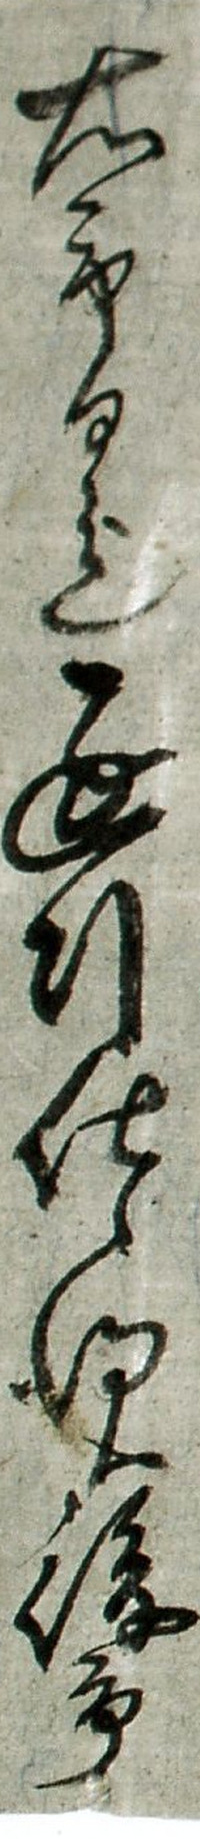右市日迄延引仕候得は後市
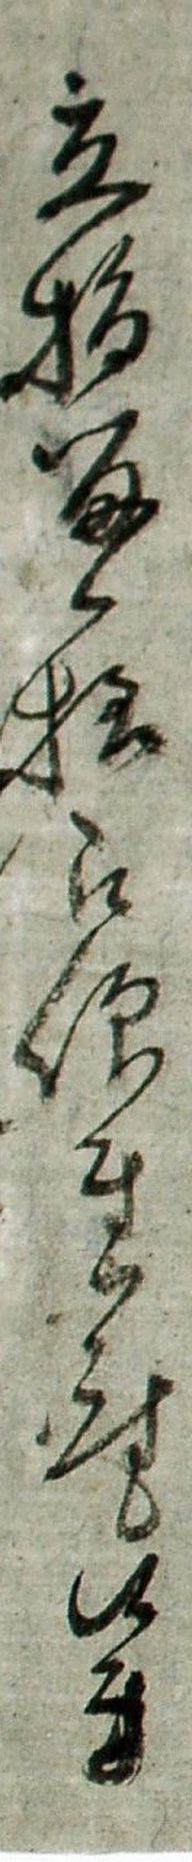立指留候様被仰付御座候付
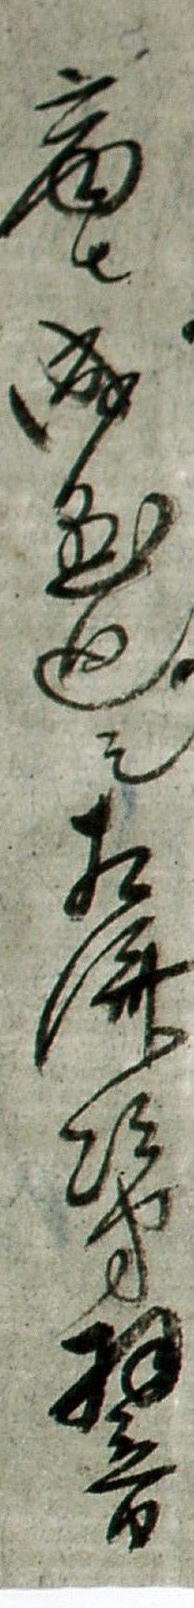商に成懸廻し相済次第翌日
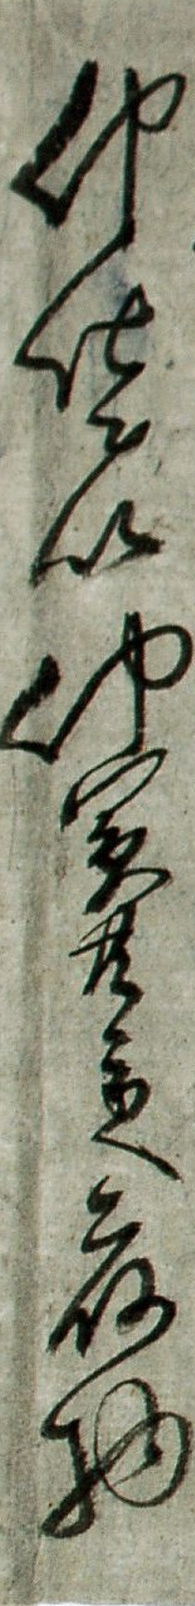仲仕を以仲買共方へ荷物
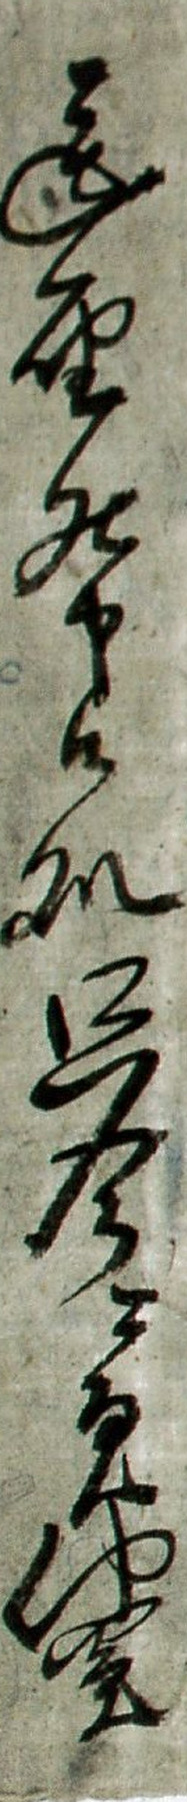送届居申候処只今にては仲買

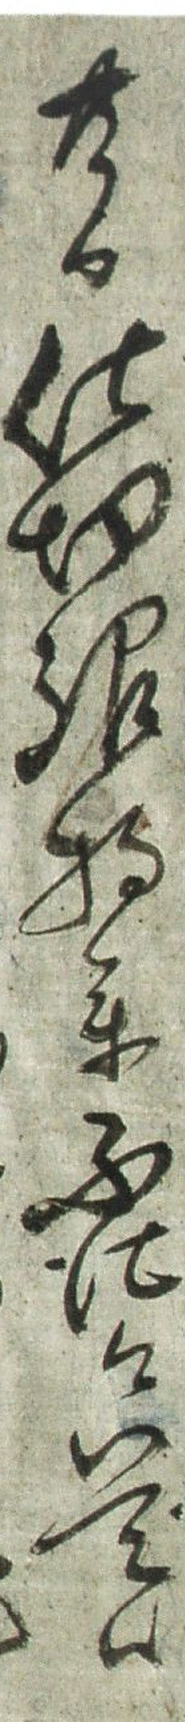共は仕切銀持参不仕候はでは
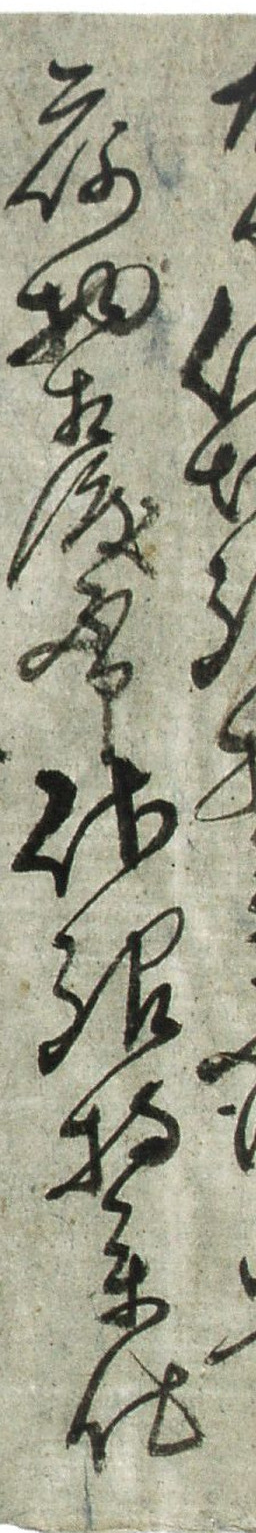荷物相渡不申代銀持参仕
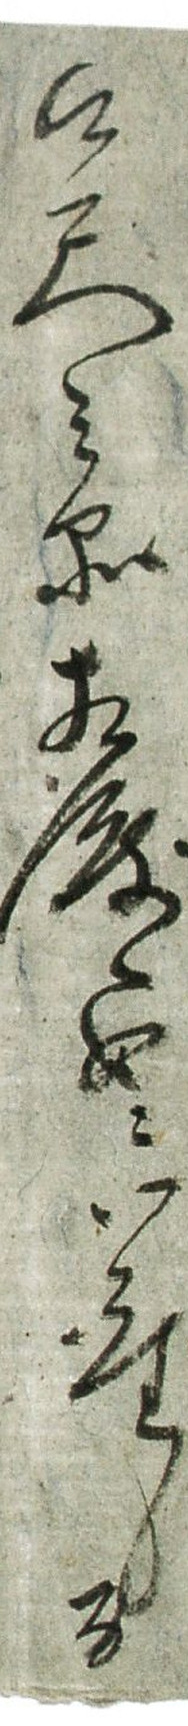候尺之品相渡候義に御座候間
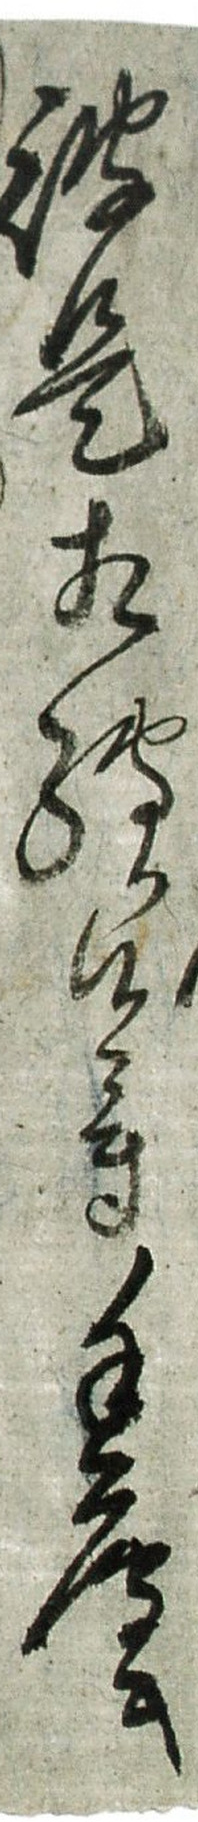彼是相伝り候に付手広き
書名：(美馬三好両郡百姓共煙草問屋壱手勘定ニ相成迷惑願右始末承申上書付之写）
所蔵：鳴門教育大学 Naruto University of Education
